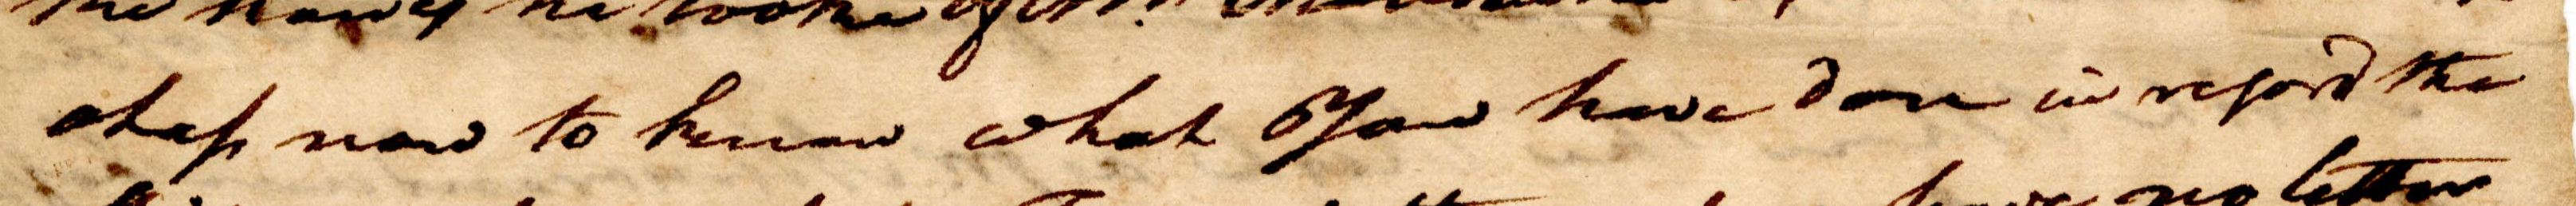shep now to know what you have done in regard the
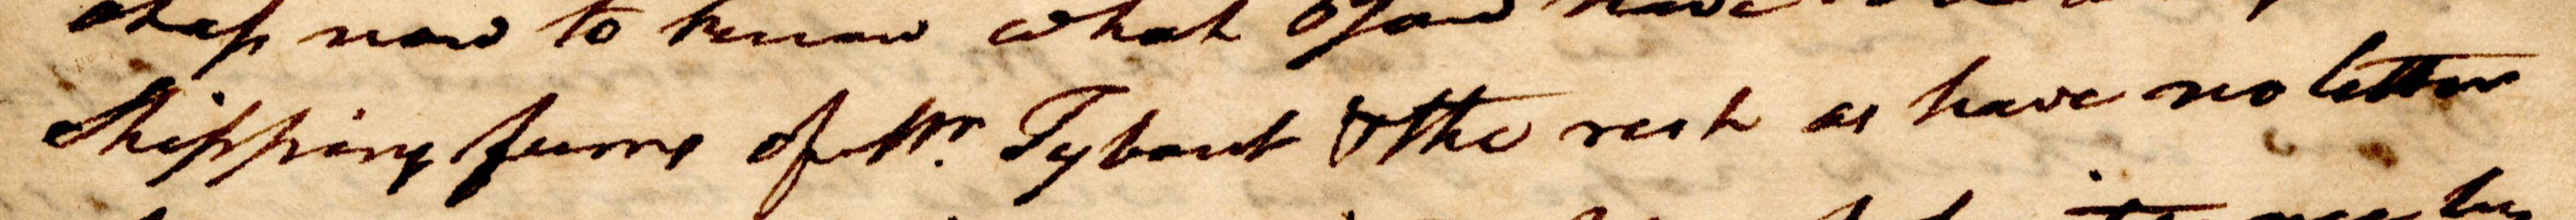Shipping furrs of M^r. Tybaut & the rest as have no letter
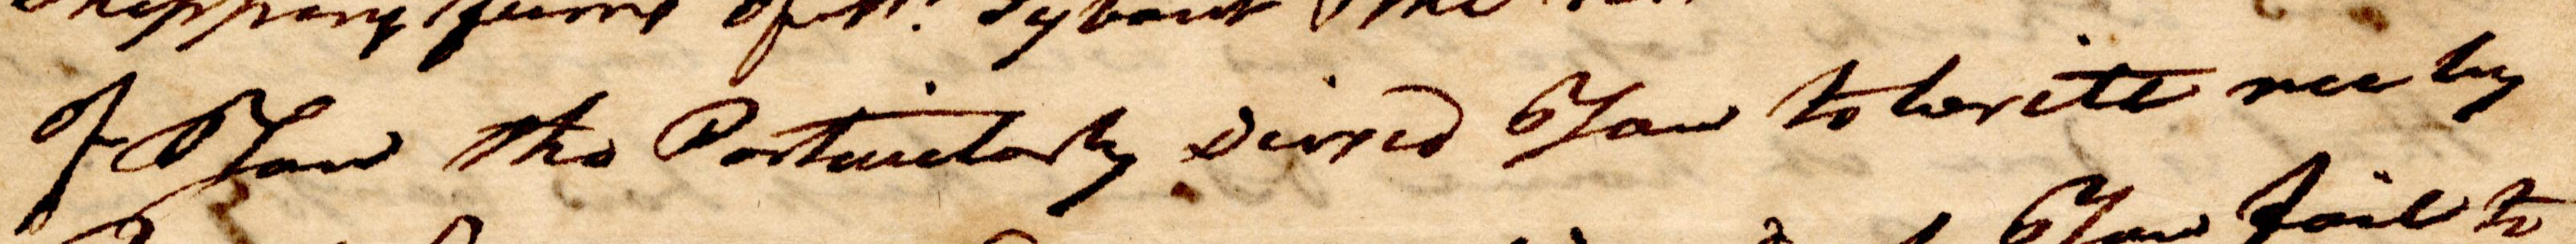of You the particulars desired You to write me by
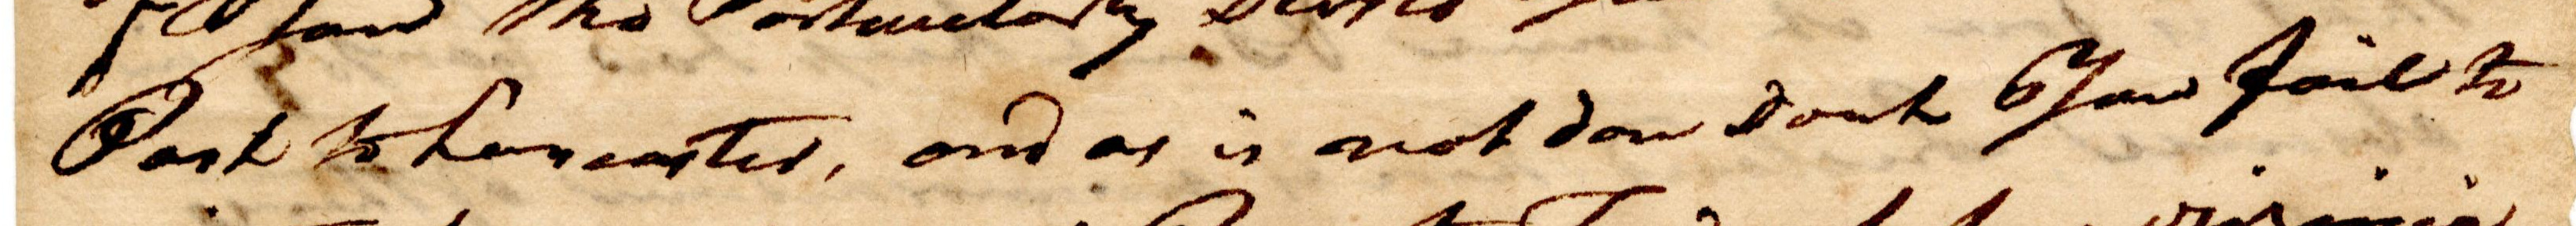Post to Lancaster, and as is not don Dont You fail to
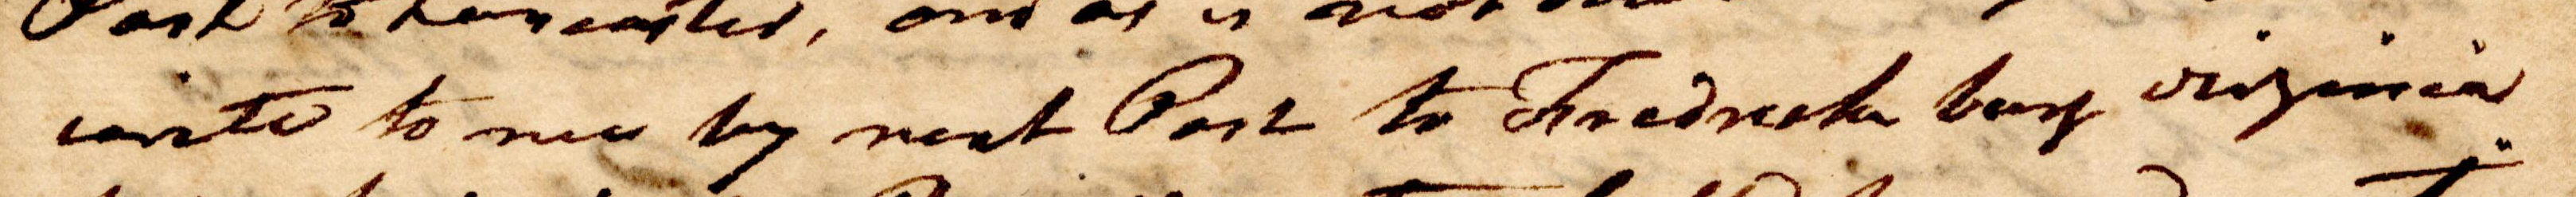write to me by next Post to Fredricksburg virginia
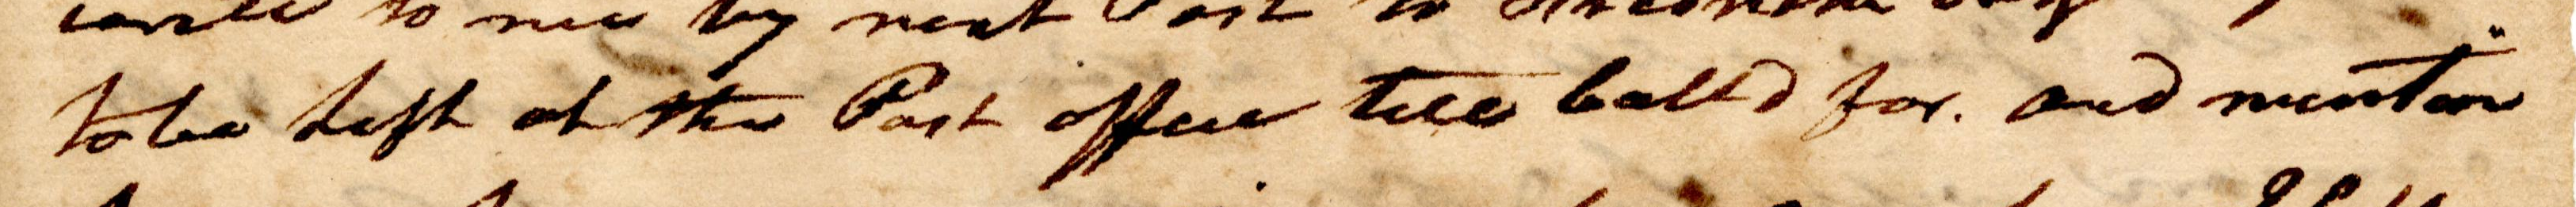to be Left at the Post office till Calld for and maintain
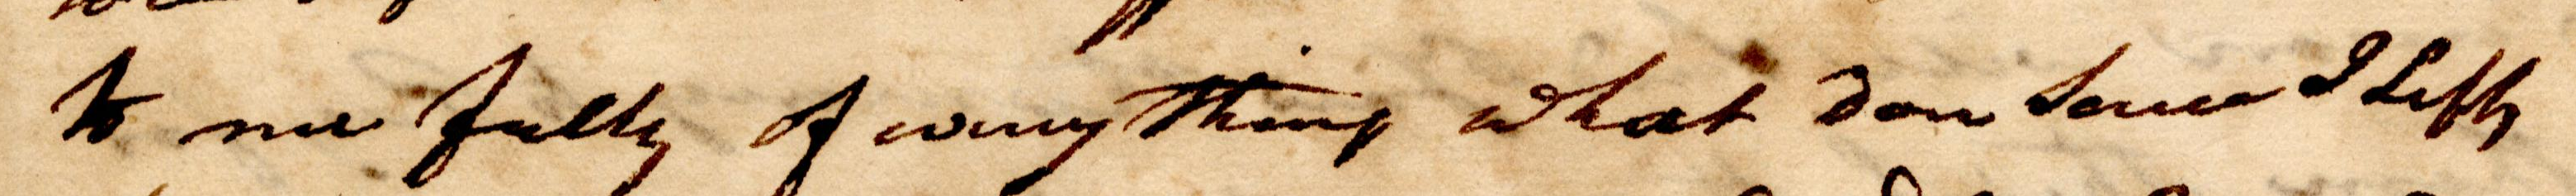to me fully of every thing what don sence I left
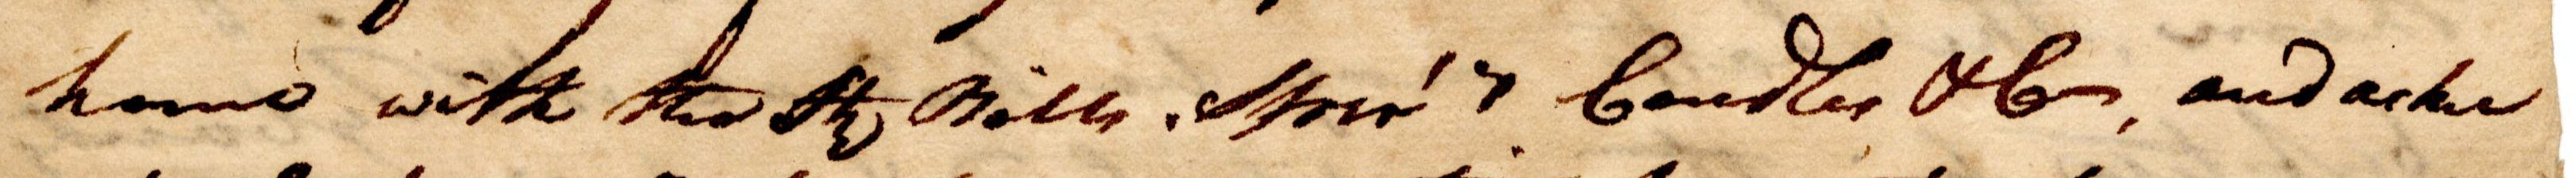home with two [__] Bills Stem'^g 4 candles &C-, and aske
